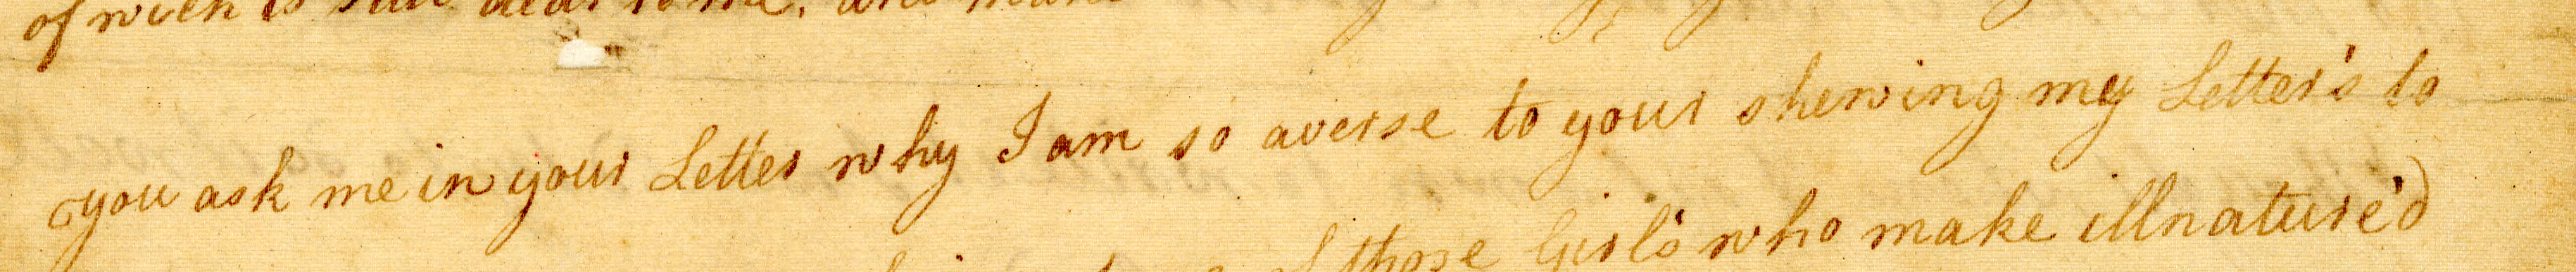you ask me in your Letter why I am so averse to your shewing my Letter's to
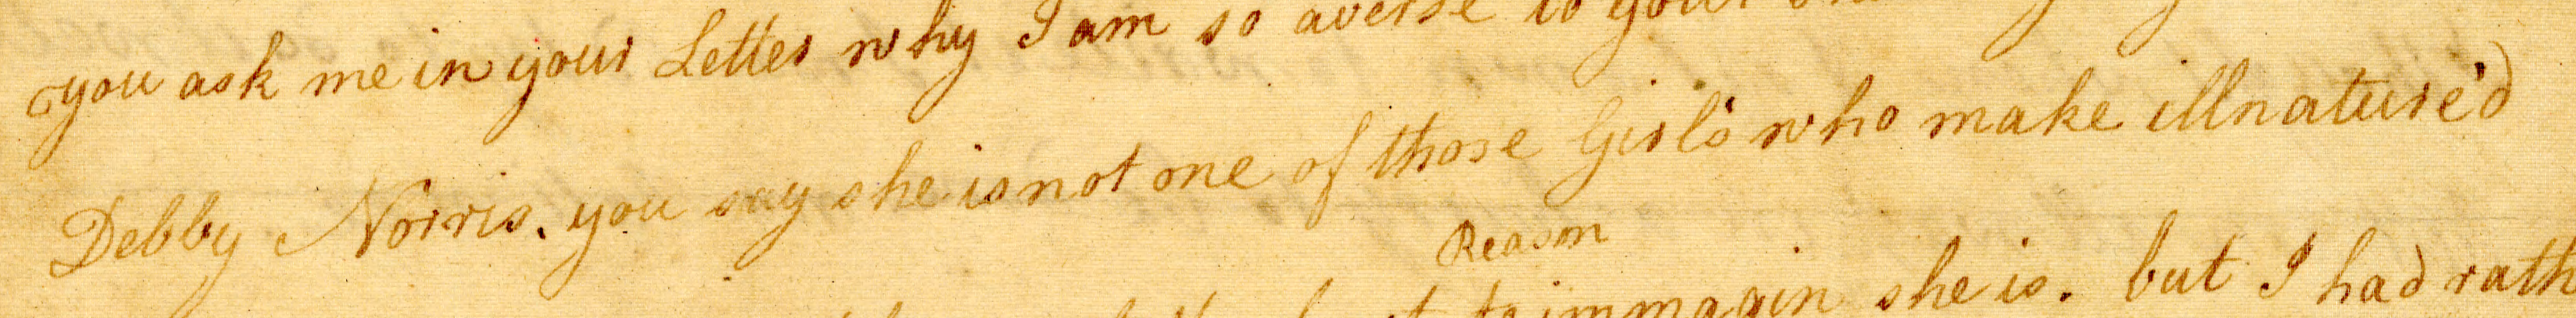Debby Norris you say she is not one of those Girls who make illnature'd
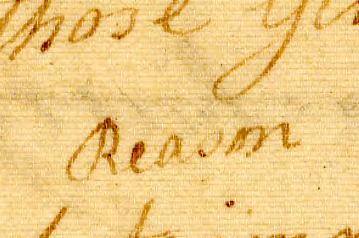Reason
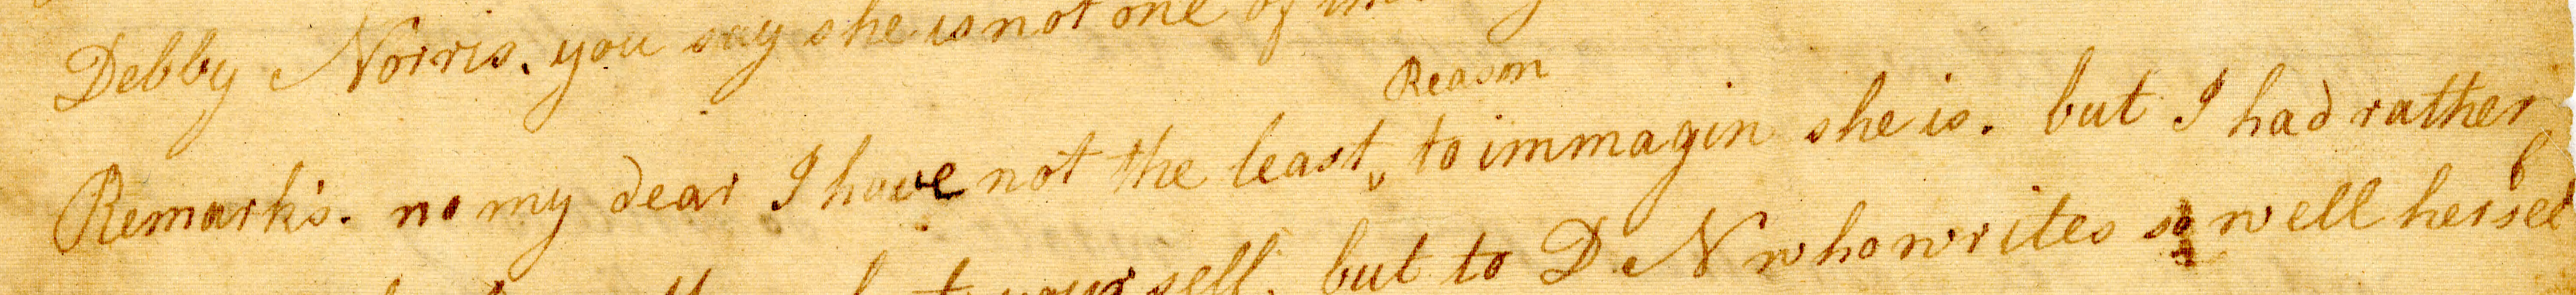Remarks. no my dear I have not the least ^ to immagin she is. but I had rather
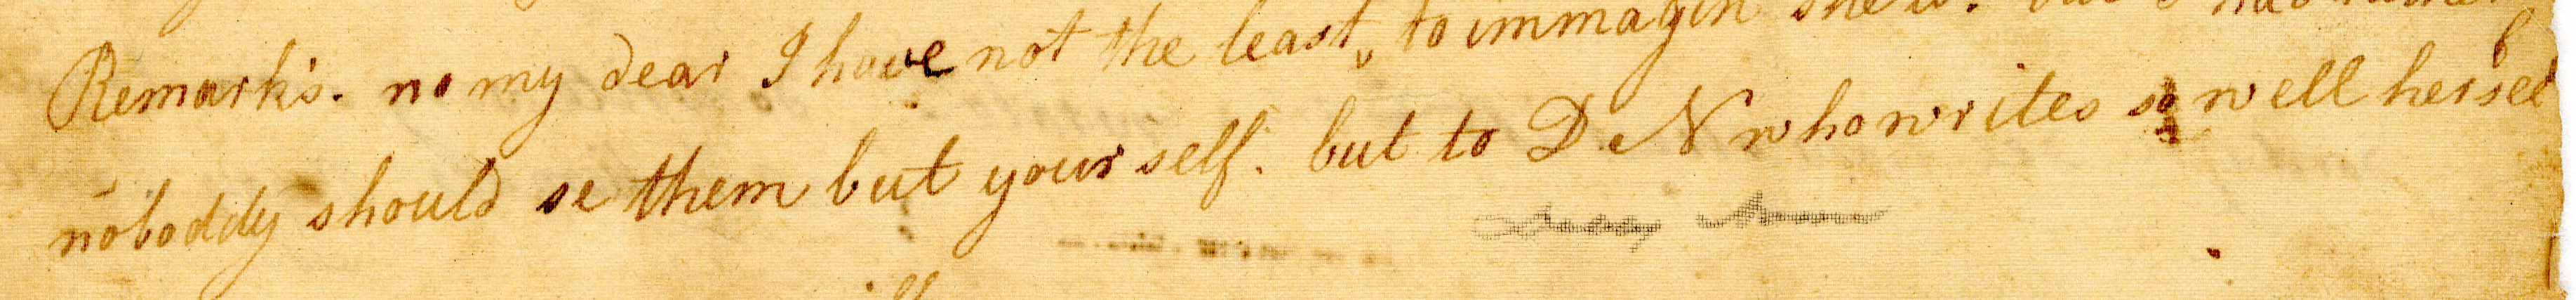nobody should se them but yourself but to DN who writes so well hersel^f
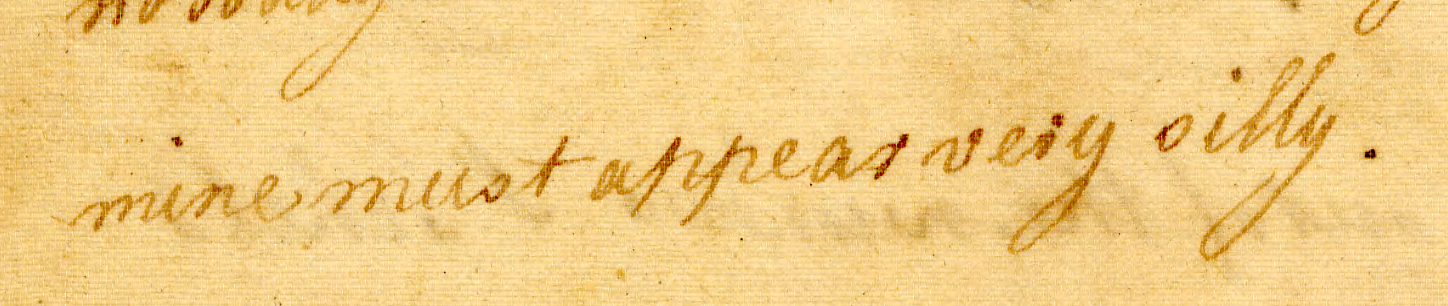mine must appear very silly.
